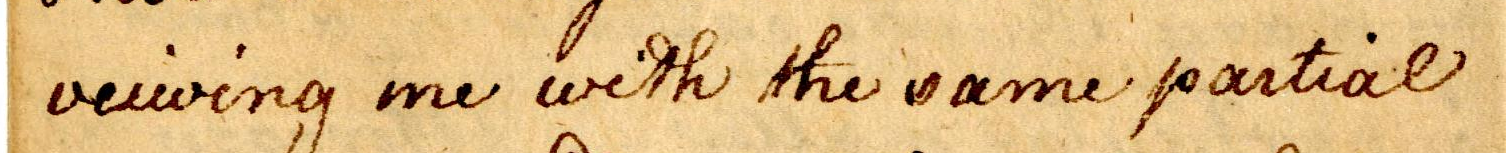veiwing me with the same partial
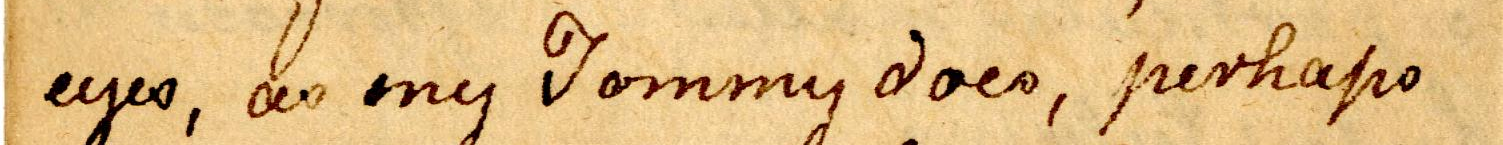eyes, as my Tommy does, perhaps
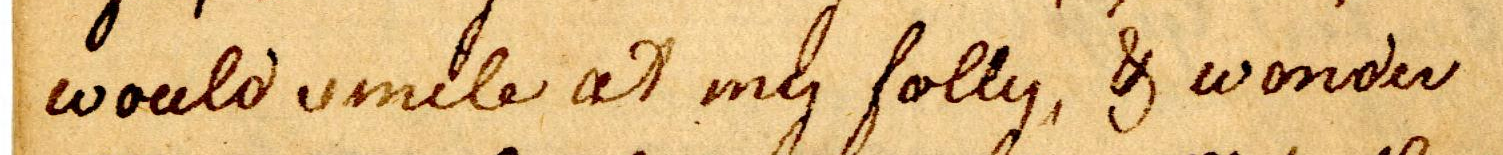would smile at my folly, & wonder
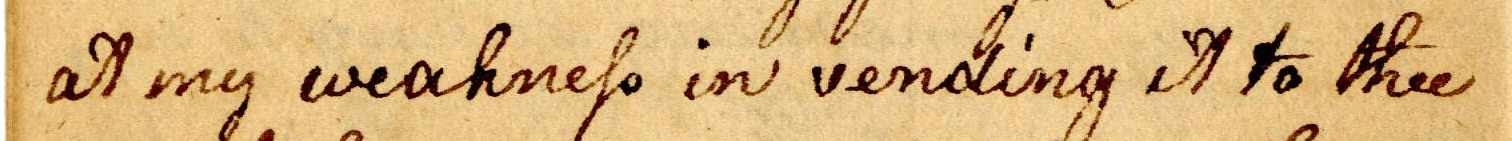at my weakness in sending it to thee
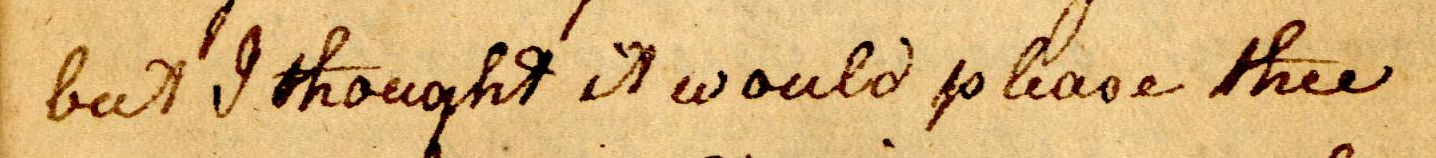but I thought it would please thee
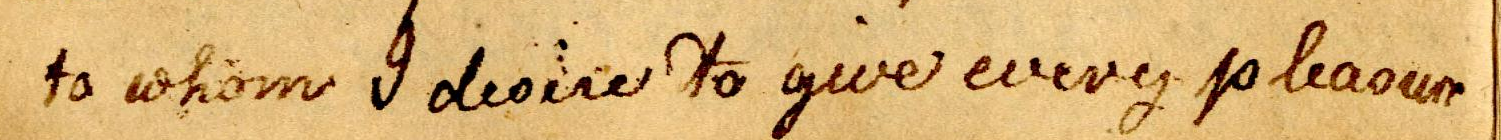to whom I desire to give every pleasure
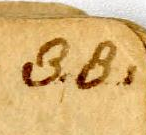38
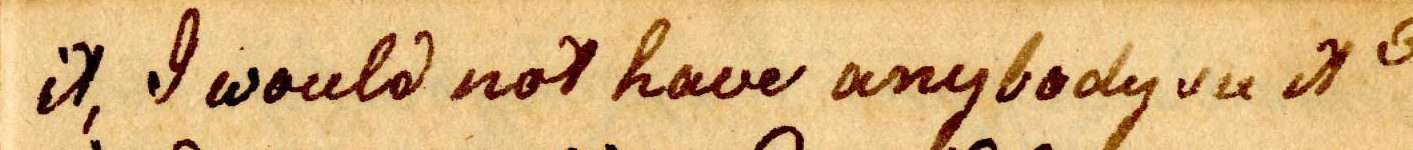it, I would not have anybody see it
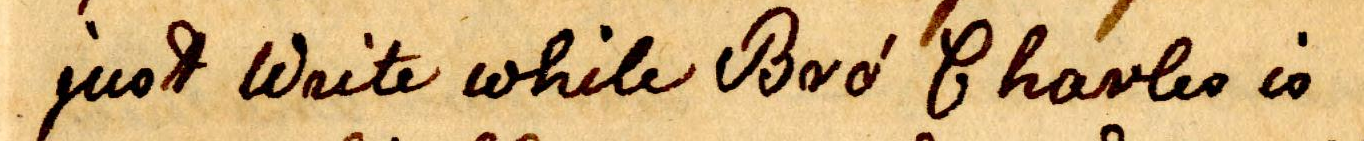just Write while Bro' Charles is
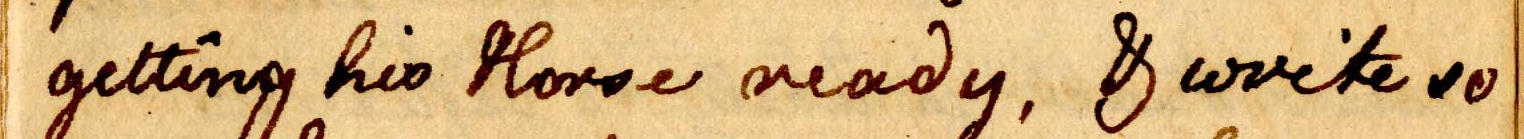getting his Horse ready, & write so
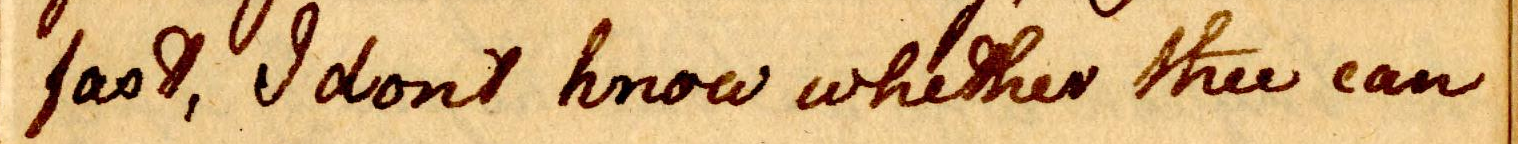fast, I dont know whether thee can
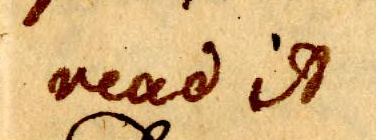read it
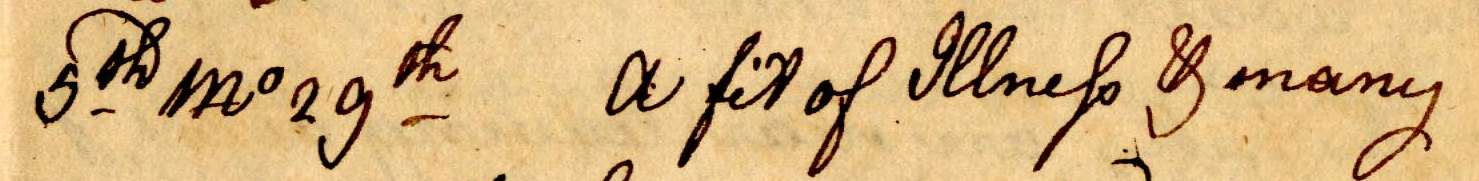5^th M^o 29^th- A fit of Illness & many
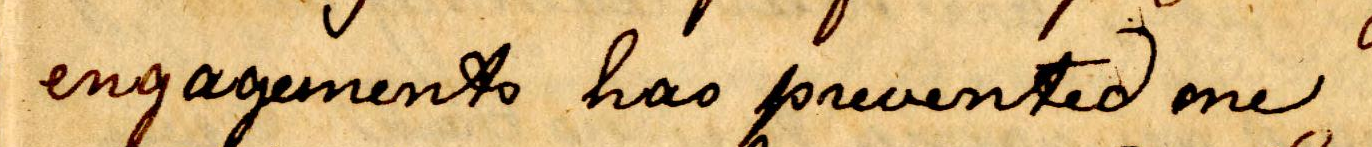engagements has prevented me
